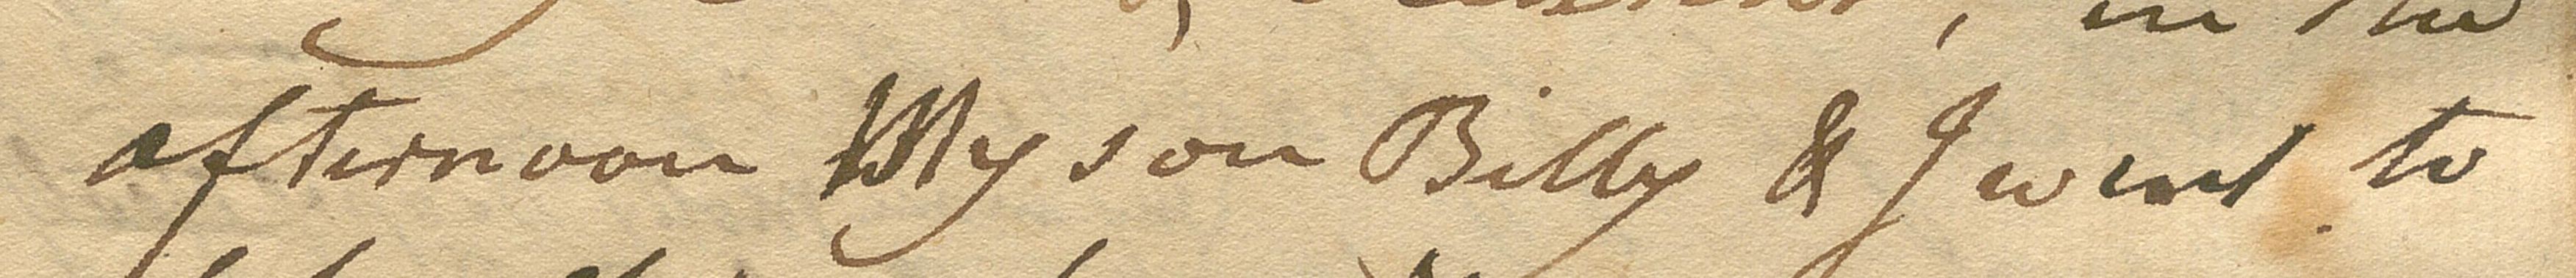afternoon My son Billy & I went to
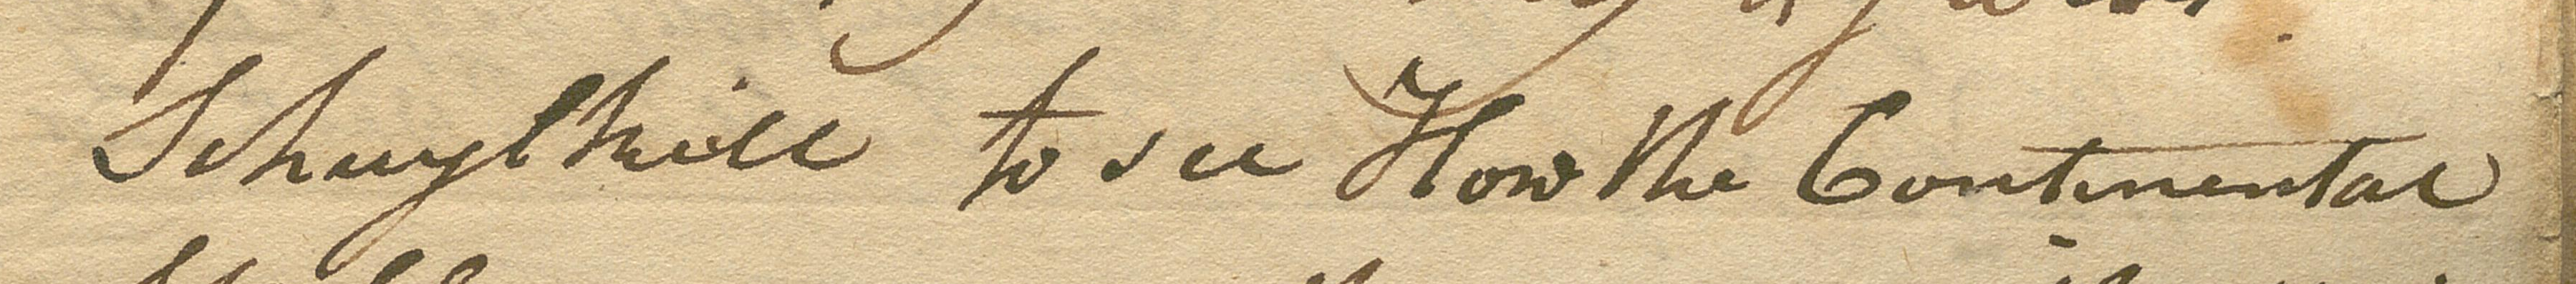Schuylkill to see How the Continental
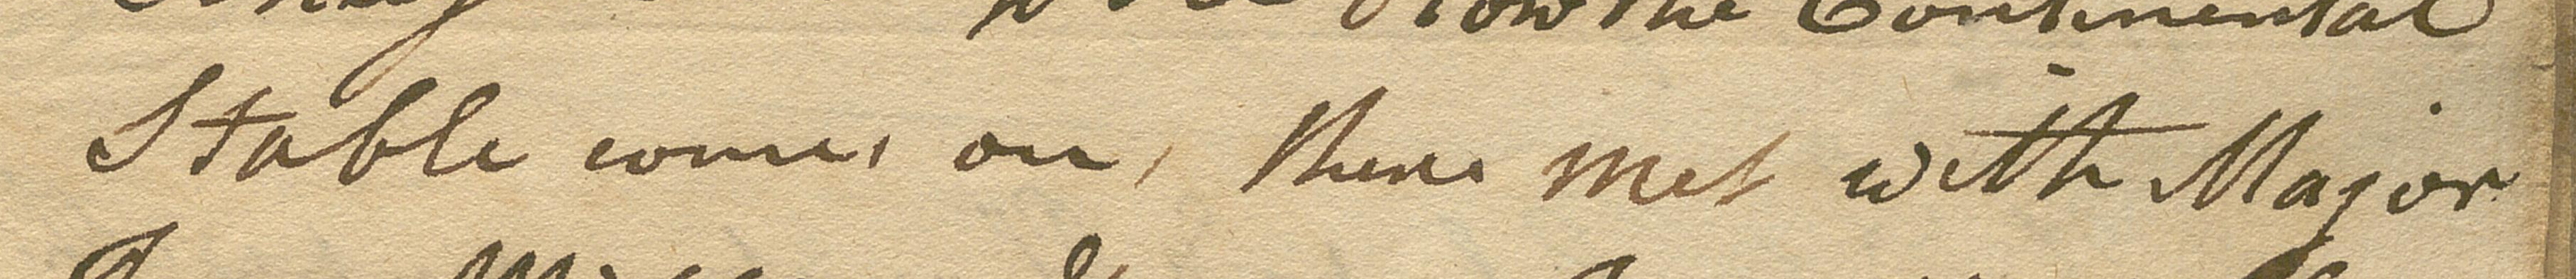Stable comes on, there met with Major
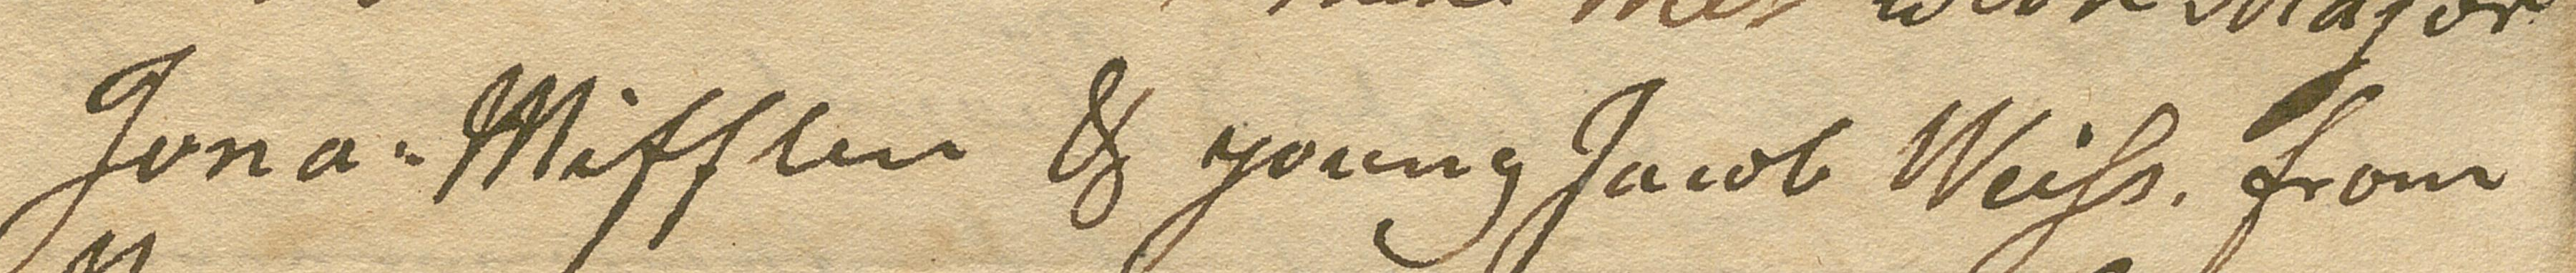Jona: Mifflin & young Jacob Weiss. from
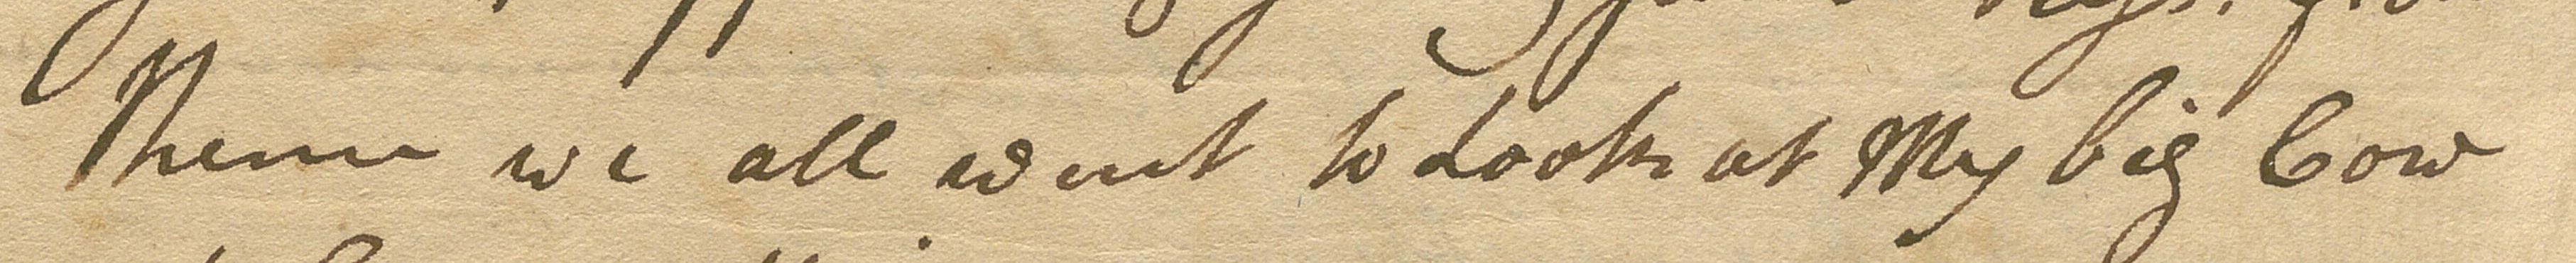thence we all went to Look at My big Cow
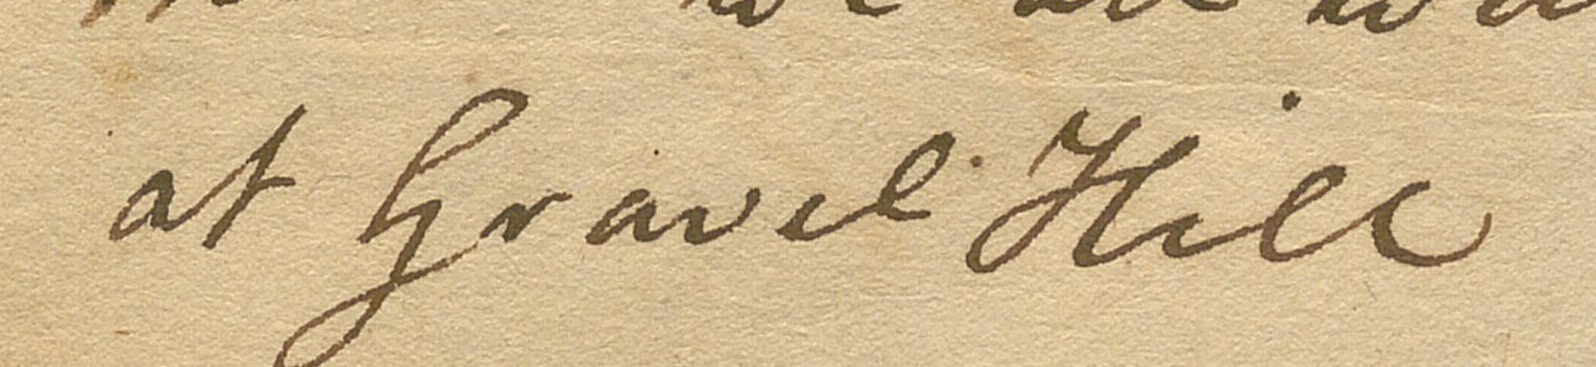at Gravel Hill
